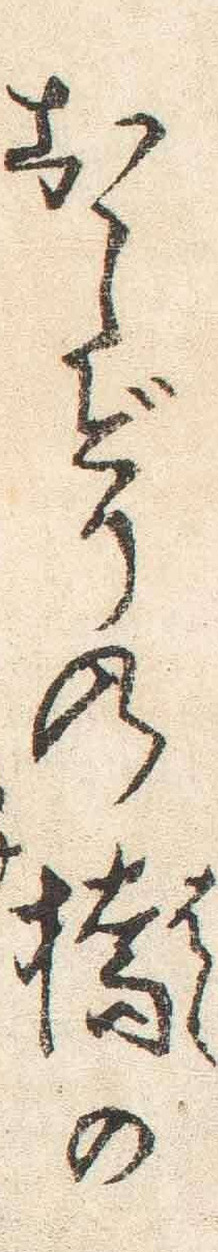おしどりの橋の
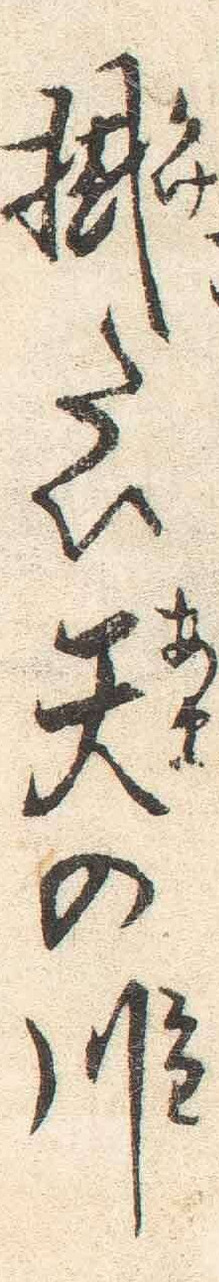掛たは天の川
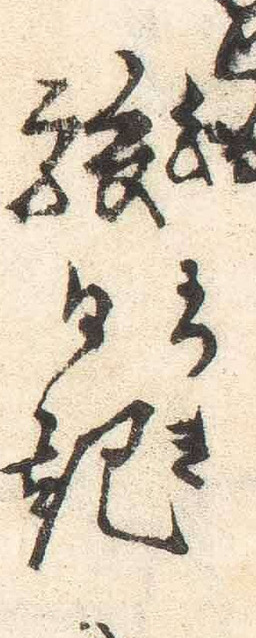旅日記
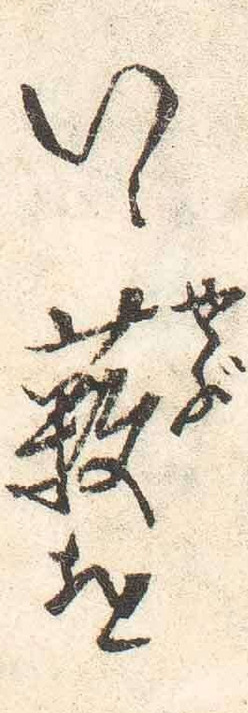いゝ藪を
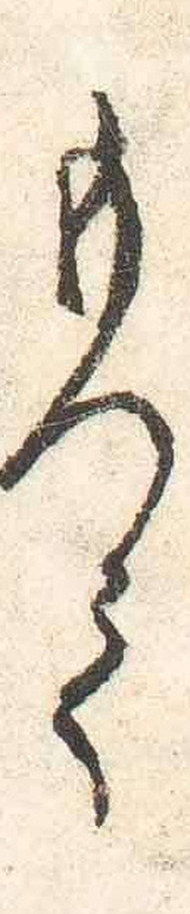もつて
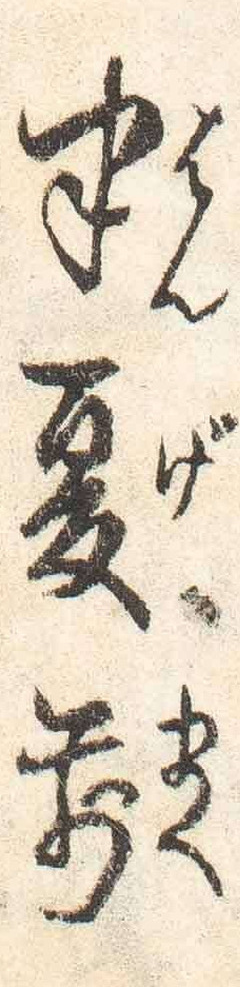半夏前
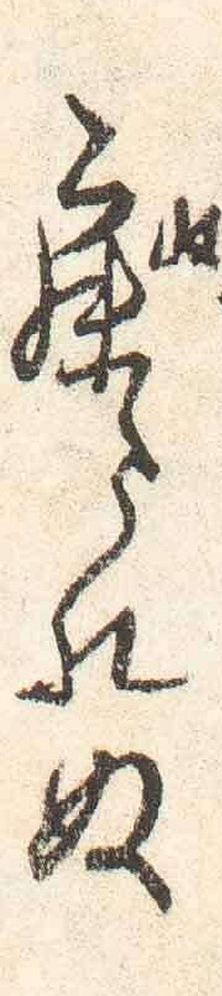寝られぬ
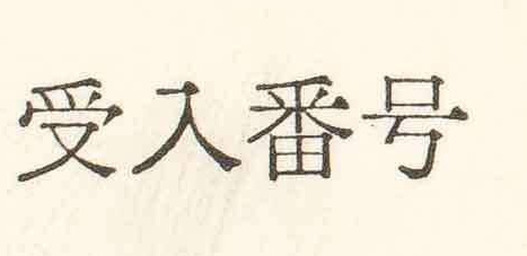受入番号
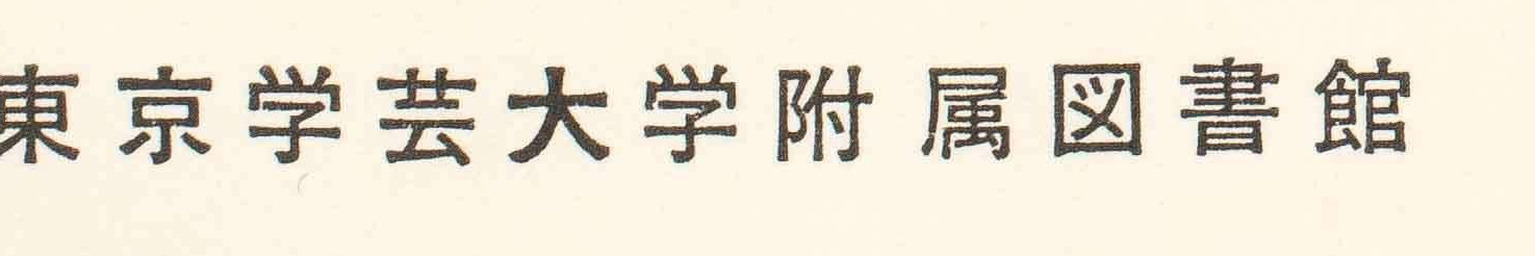東京学芸大学附属図書館
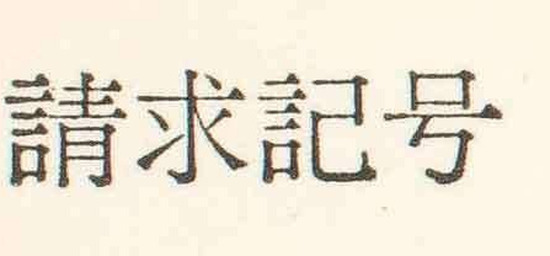請求記号
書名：画本柳樽
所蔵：東京学芸大学附属図書館 国文学研究資料館
